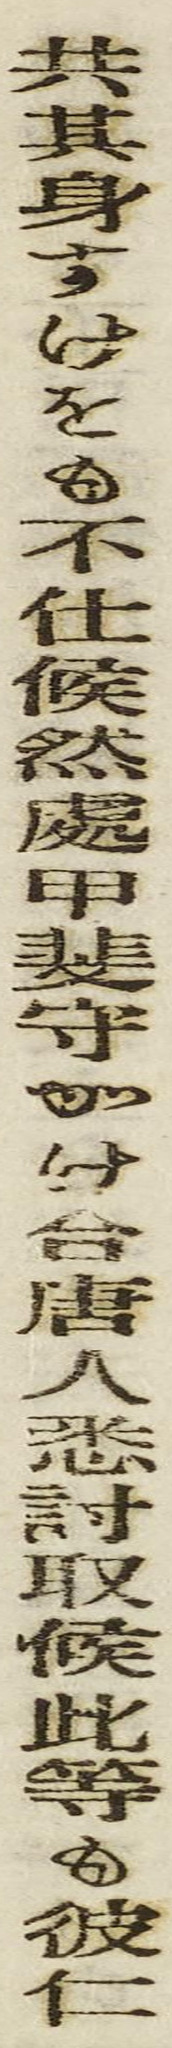共其身すけをも不仕候然処甲斐守かけ合唐人悉討取候此等も彼仁
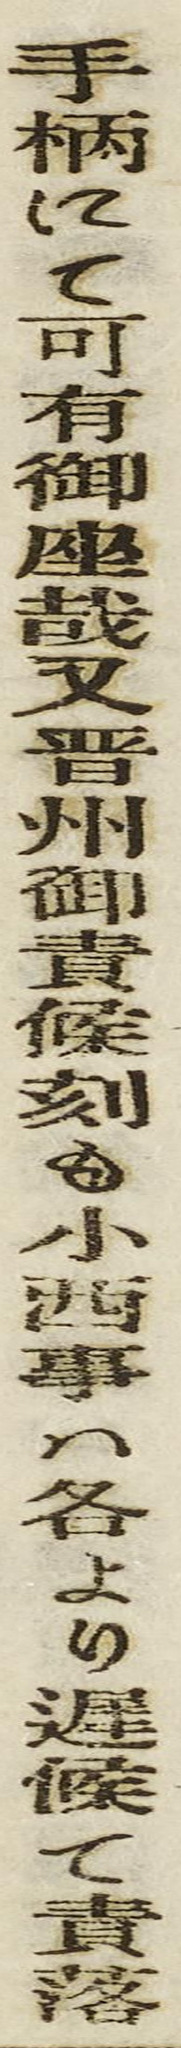手柄にて可有御座哉又晋州御責候刻も小西事ハ各より遅候て責落
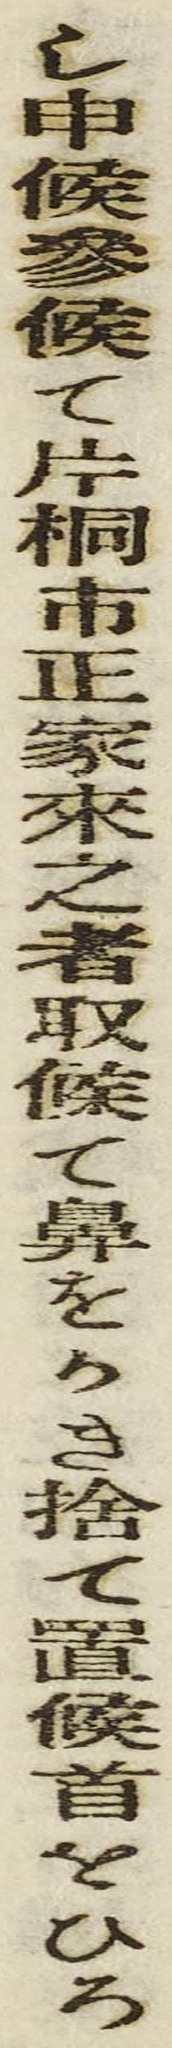し申候参候て片桐市正家来之者取候て鼻をかき捨て置候首をひろ
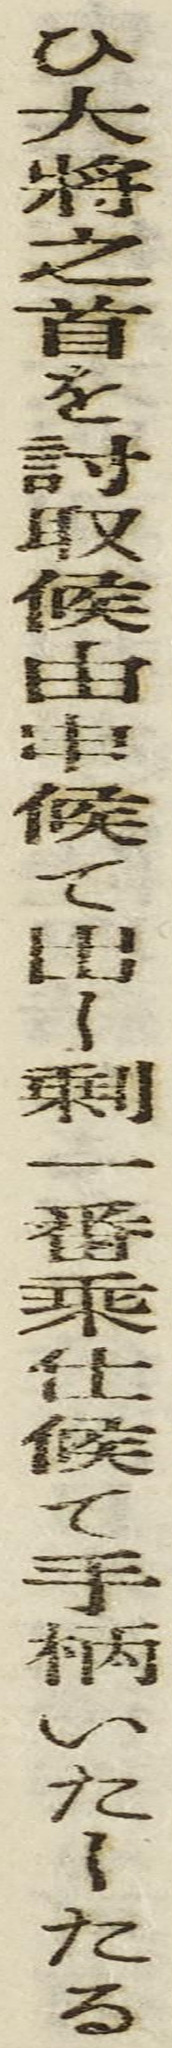ひ大将之首を討取候由申候て出し剰一番乗仕候て手柄いたしたる
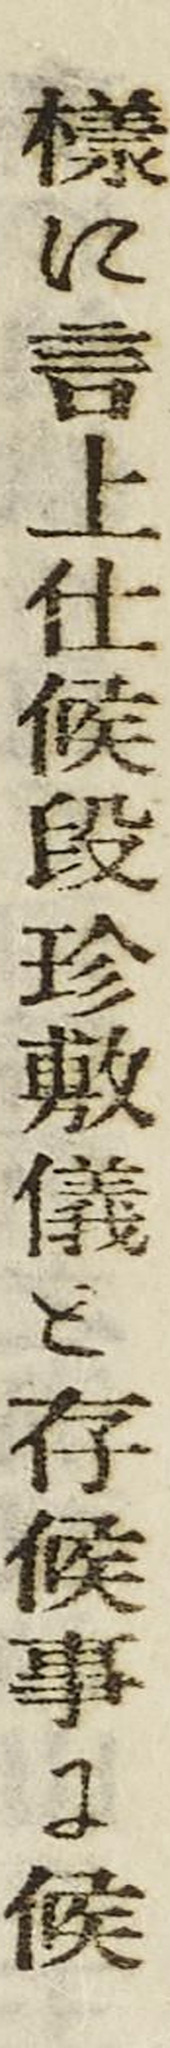樣に言上仕候段珍敷儀と存候事に候
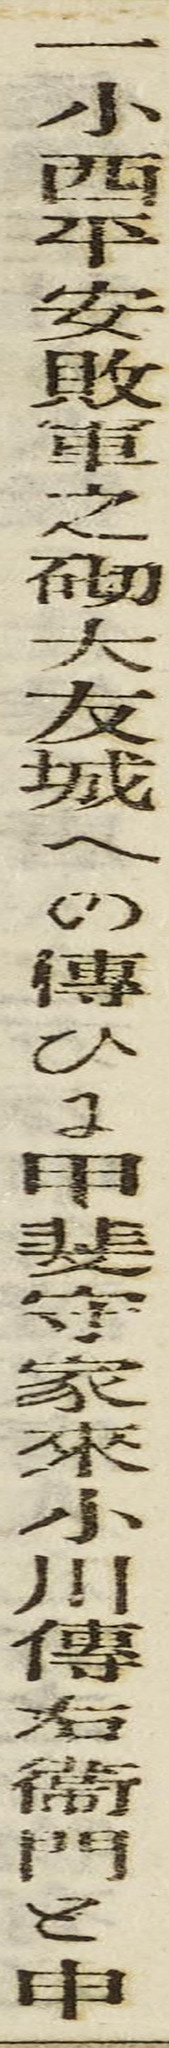一小西平安敗軍之砌大友城への伝ひに甲斐守家来小川伝右衛門と申
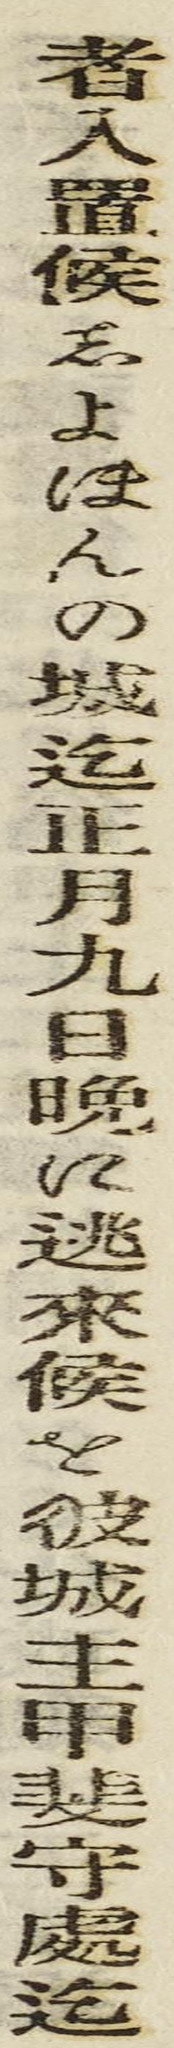者入置候しよほんの城迄正月九日晩に逃来候を彼城主甲斐守処迄
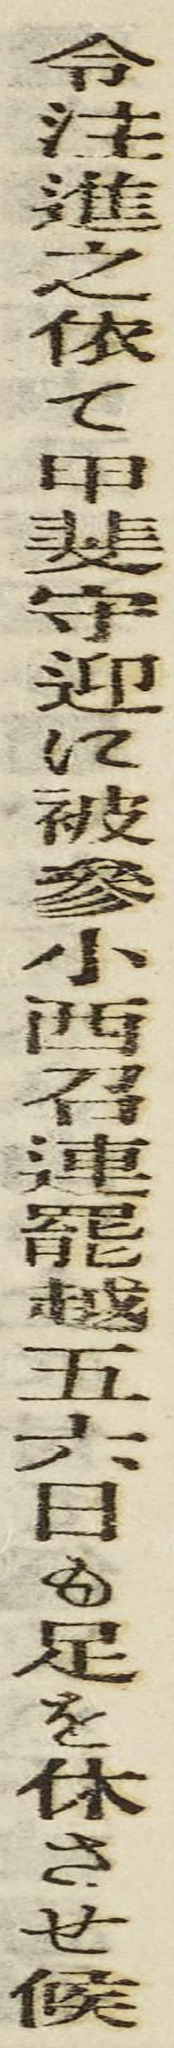令注進之依て甲斐守迎に被参小西召連罷越五六日も足を休させ候
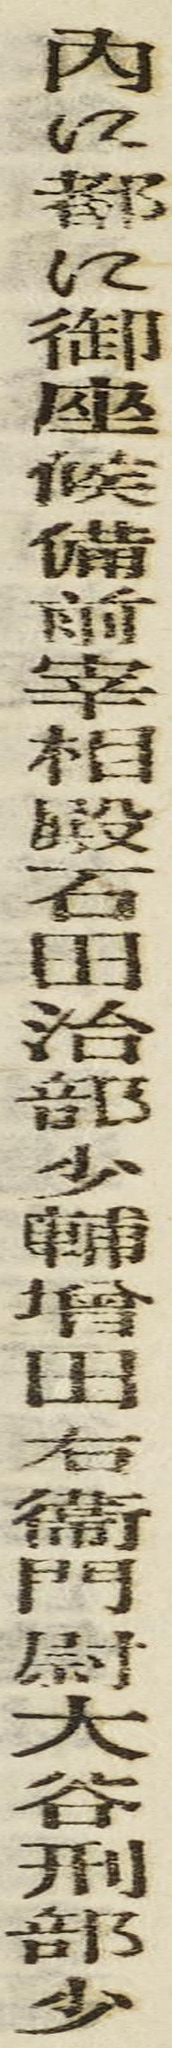内に都に御座候備前宰相殿石田治部少輔増田右衛門尉大谷刑部少
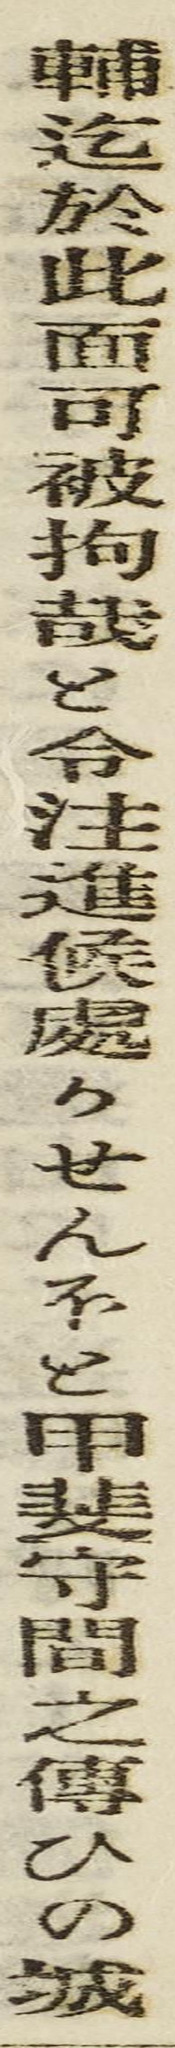輔迄於此面可被拘哉と令注進候処かせんほと甲斐守間之伝ひの城
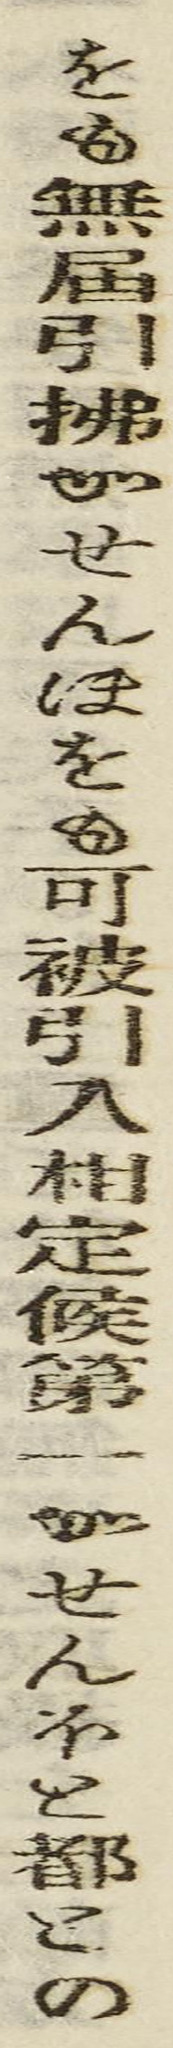をも無届引払かせんほをも可被引入相定候第一かせんほと都との
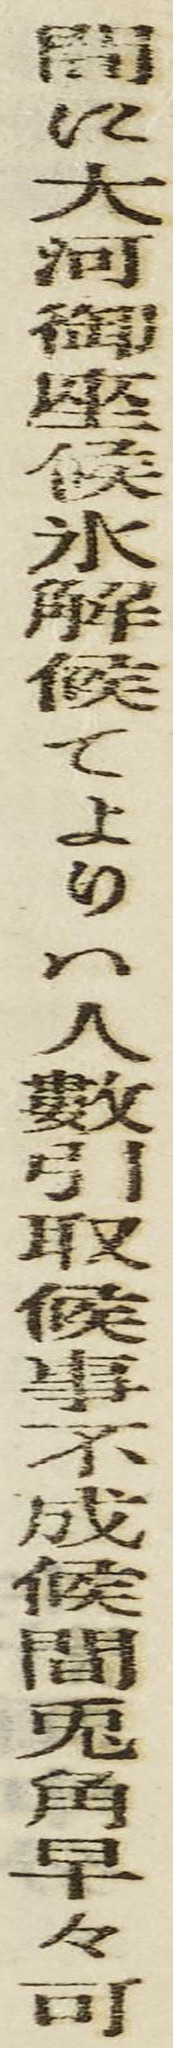間に大河御座候氷解候てよりハ人数引取候事不成候間兎角早々可
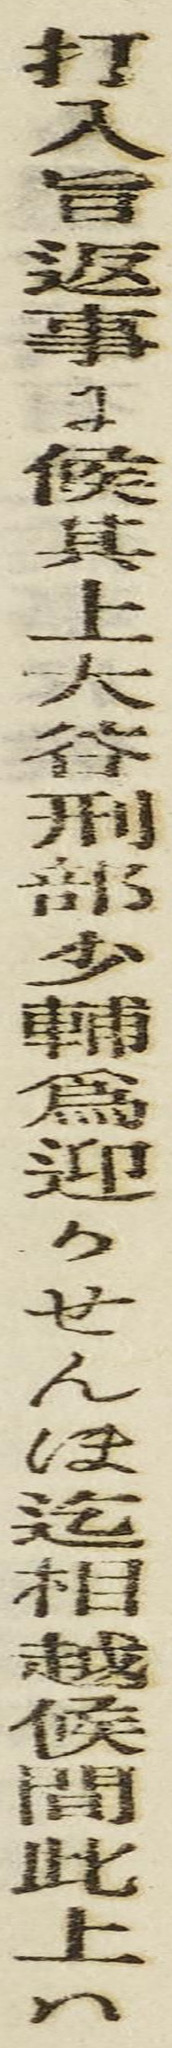打入旨返事に候其上大谷刑部少輔為迎かせんほ迄相越候間此上ハ
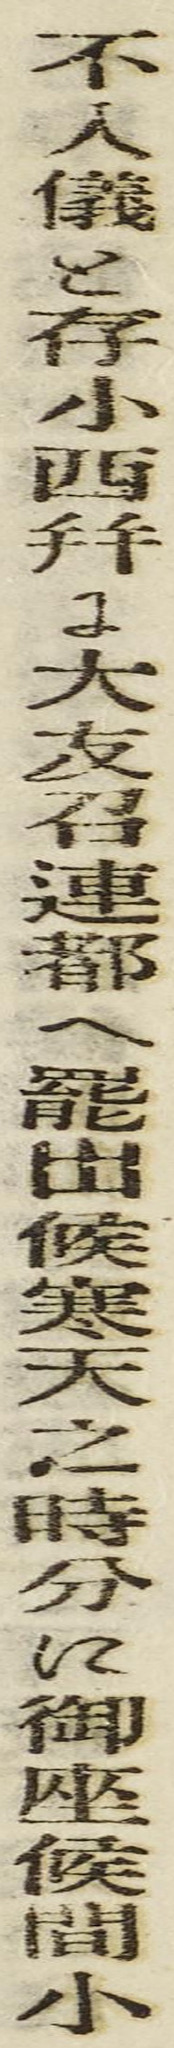不入儀と存小西幷に大友召連都へ罷出候寒天之時分に御座候間小
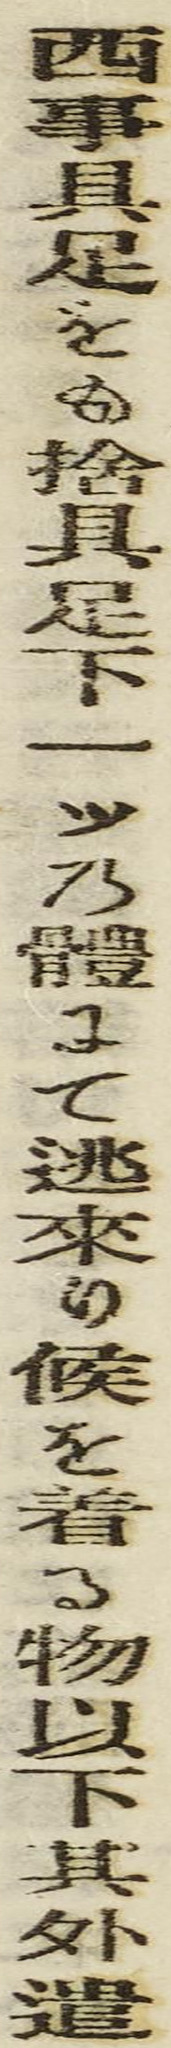西事具足をも捨具足下一ッの体にて逃来り候を着る物以下其外遣

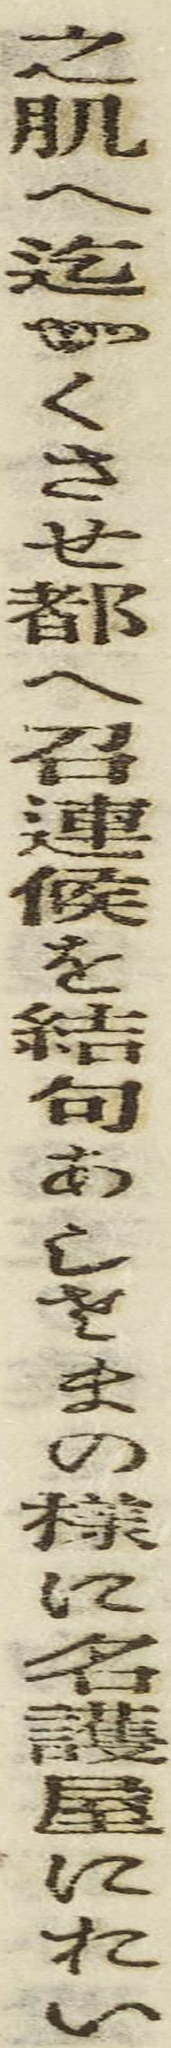之肌へ迄かくさせ都へ召連候を結句あしさまの様に名護屋におい
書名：史籍集覽　朝鮮陣古文・細井廣澤記・颶風紀事・天明七年將軍宣下次第書　全
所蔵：東京大学地震研究所図書室 Earthquake Research Institute Library, The University of Tokyo, JAPAN
